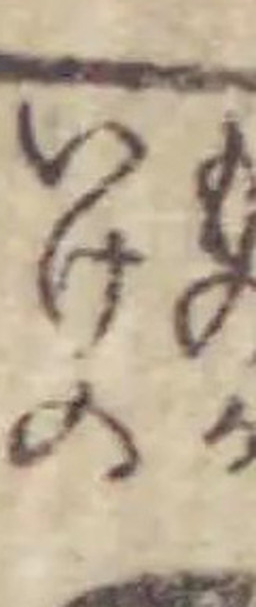いけの
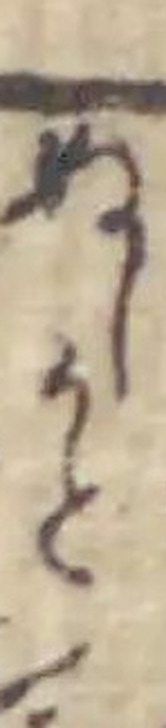ぬしかと
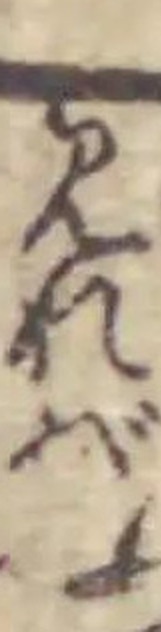見れば
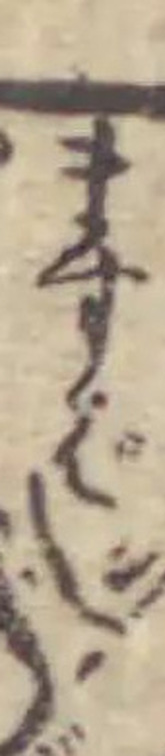ますば
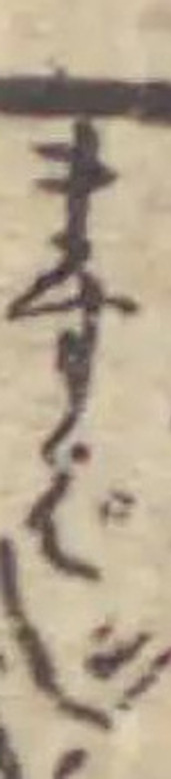ますば
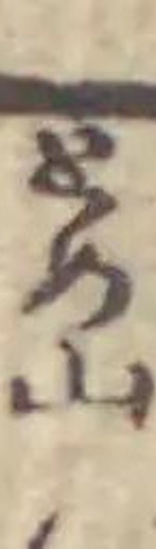とめ山
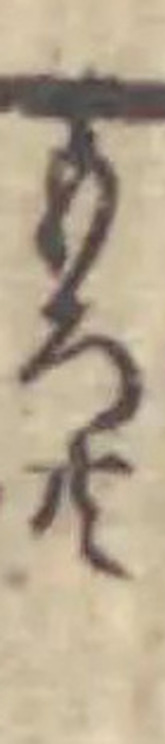もろ共
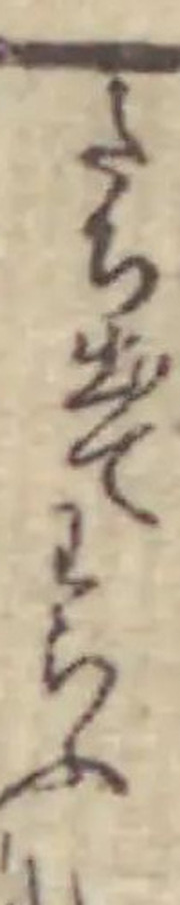たち出てわらふ
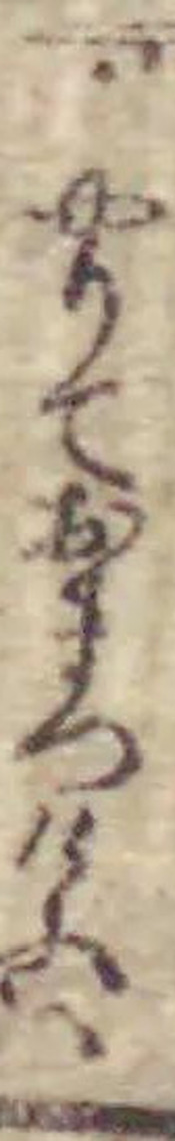やりておまつけふは
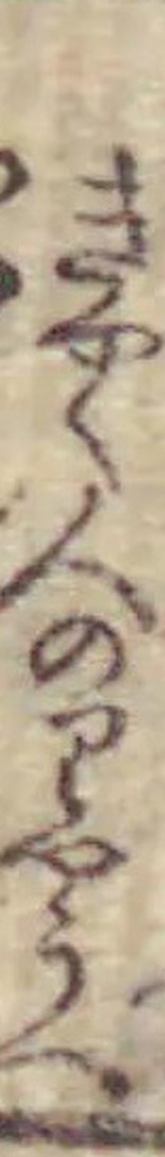きやく人のりやうへ
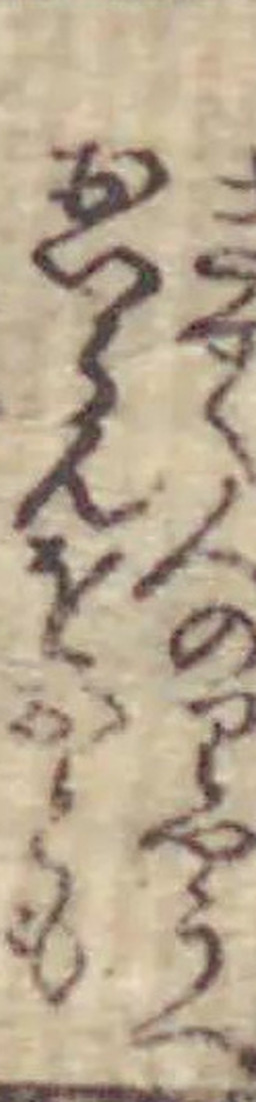おいらんをおとも
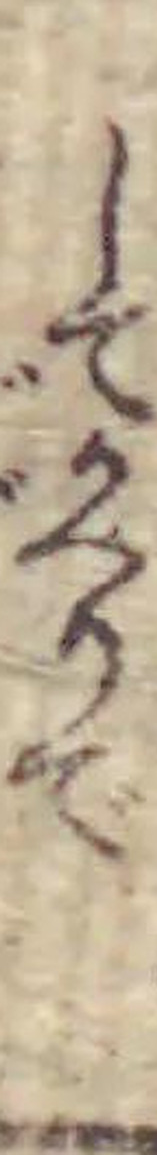してかへりで
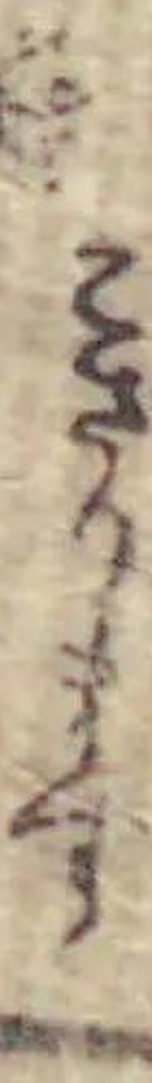ございます
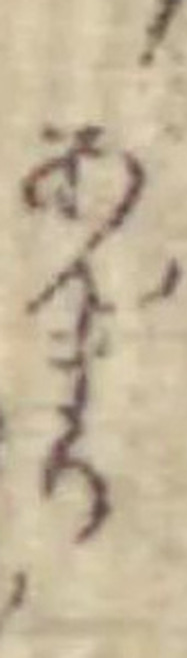あんまり
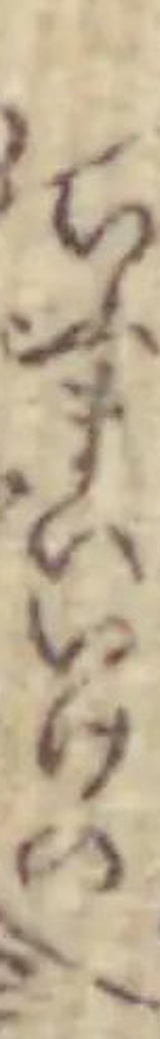いふまいいけの
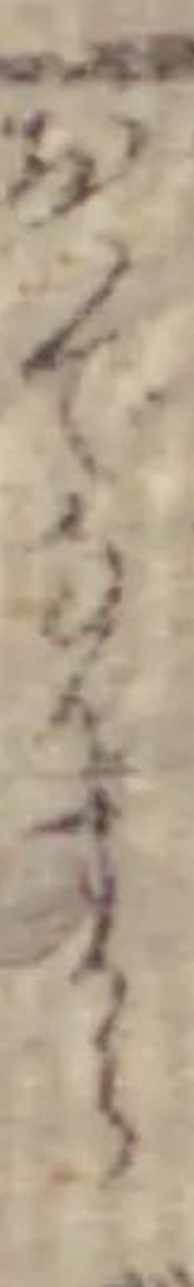おいでなんすから
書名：亀山人家妖 3巻
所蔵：国立国会図書館 National Diet Library, JAPAN
